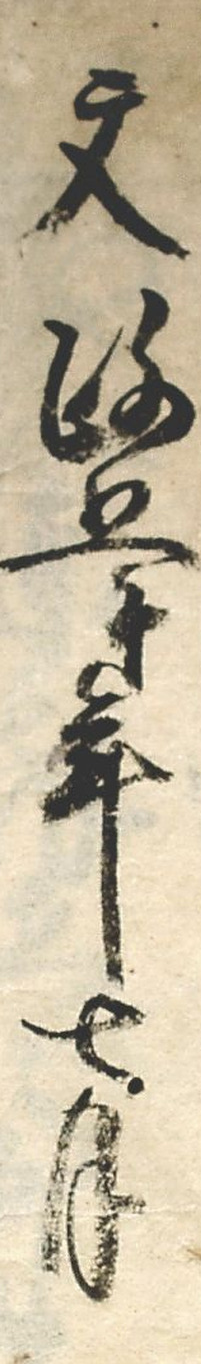文政五午年七月
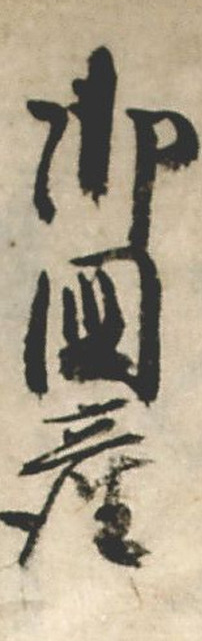御国産
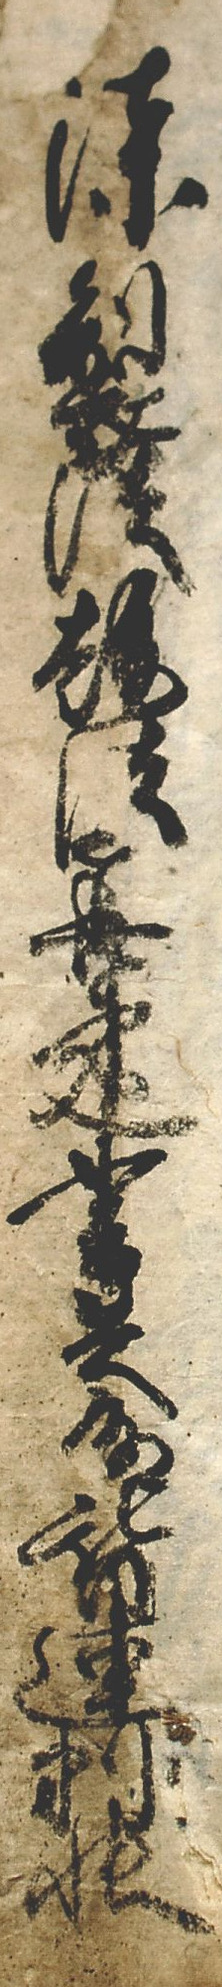漆製法趣法算建書共取替連判帳

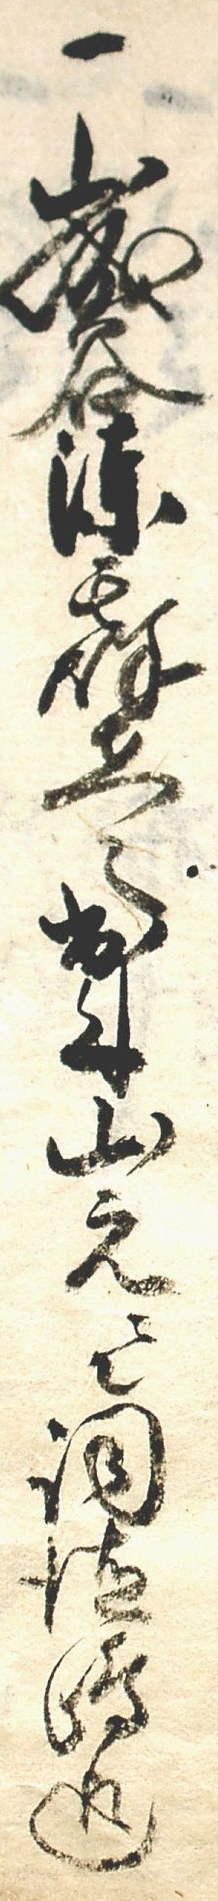一山城谷漆其余在々出来山元にて調徳島迄
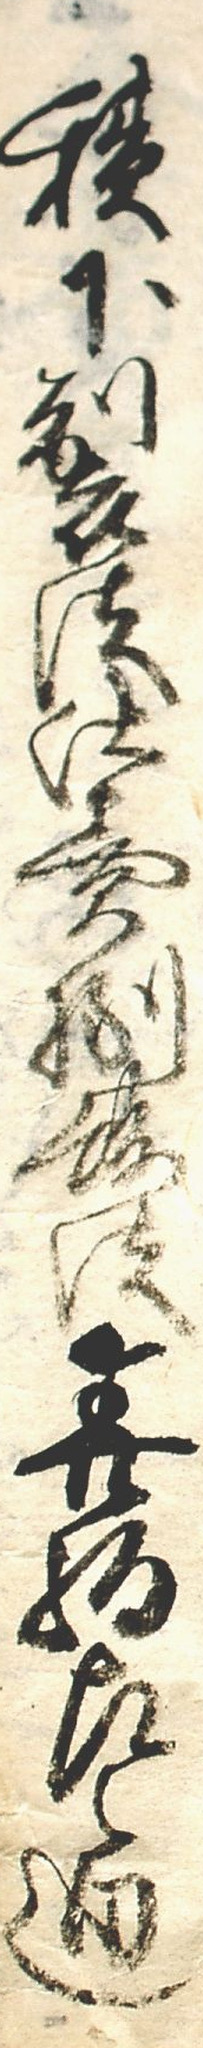積下製法仕売払捌趣法算建左之通
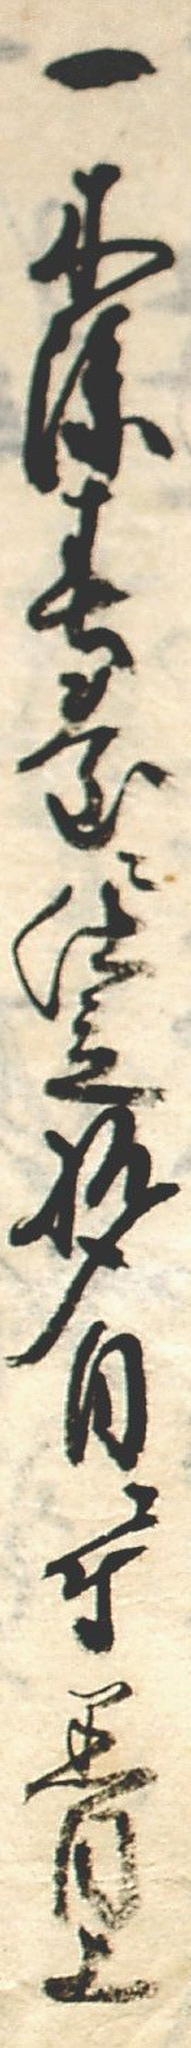一木漆春慶に仕立拾〆目に付差上
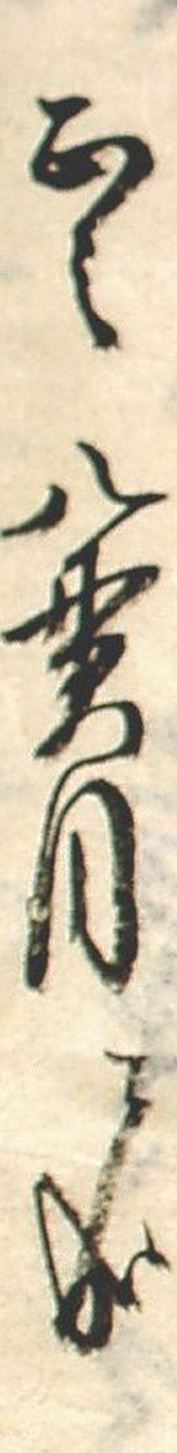正ミ八貫目に成
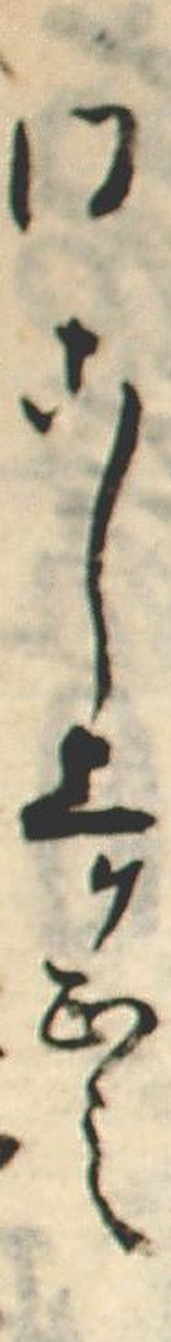一同こし上け正ミ
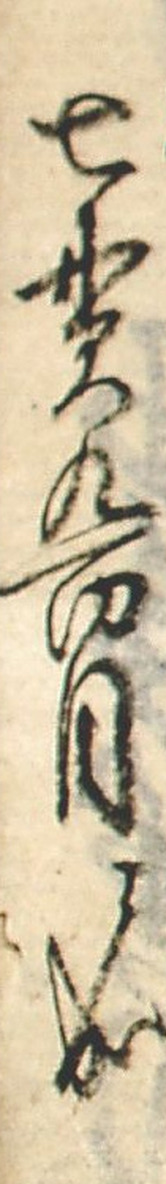七貫九百目に成

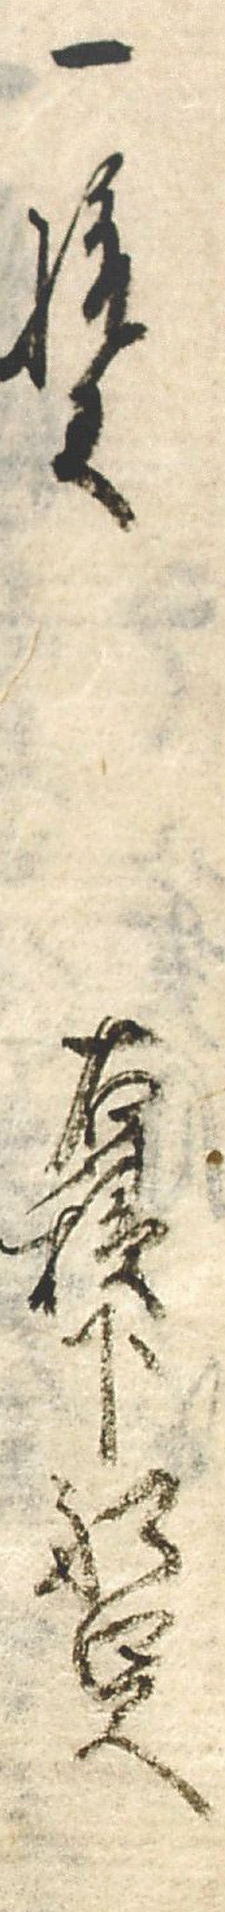一拾匁右積下船賃
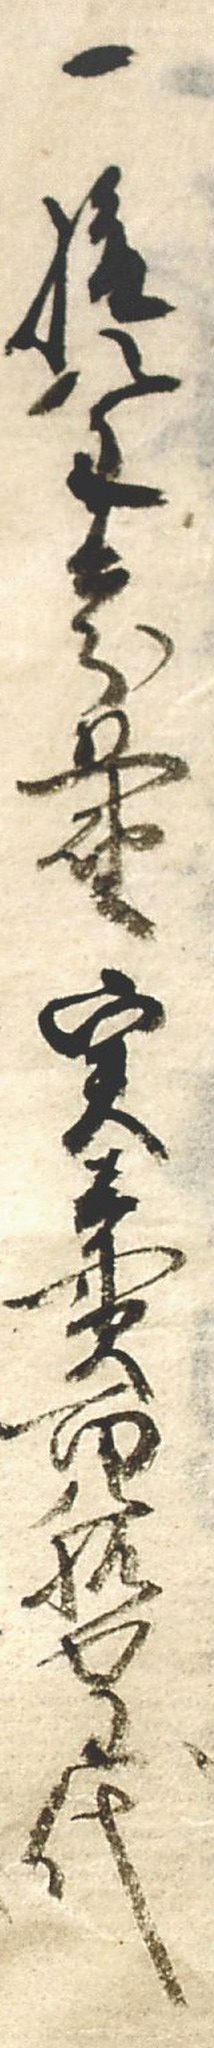一拾八匁分五厘実壱貫百八拾五匁代
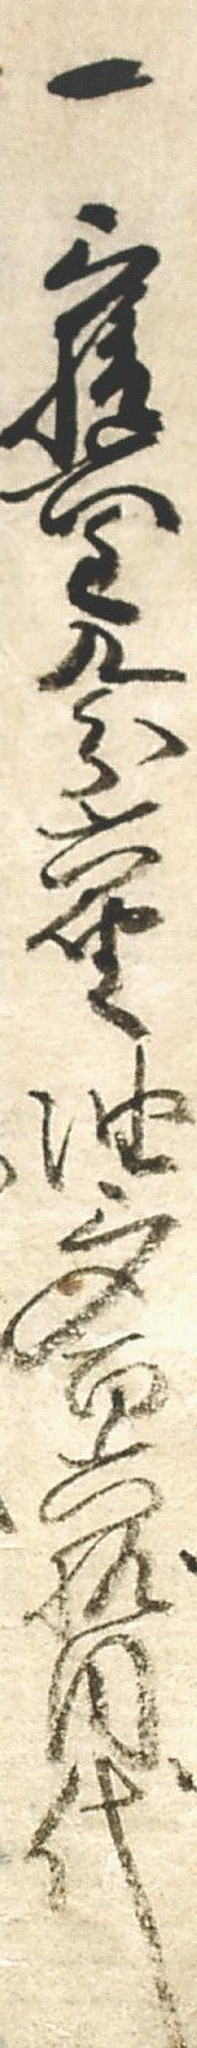一三拾六匁九分六厘油三〆百六拾目代
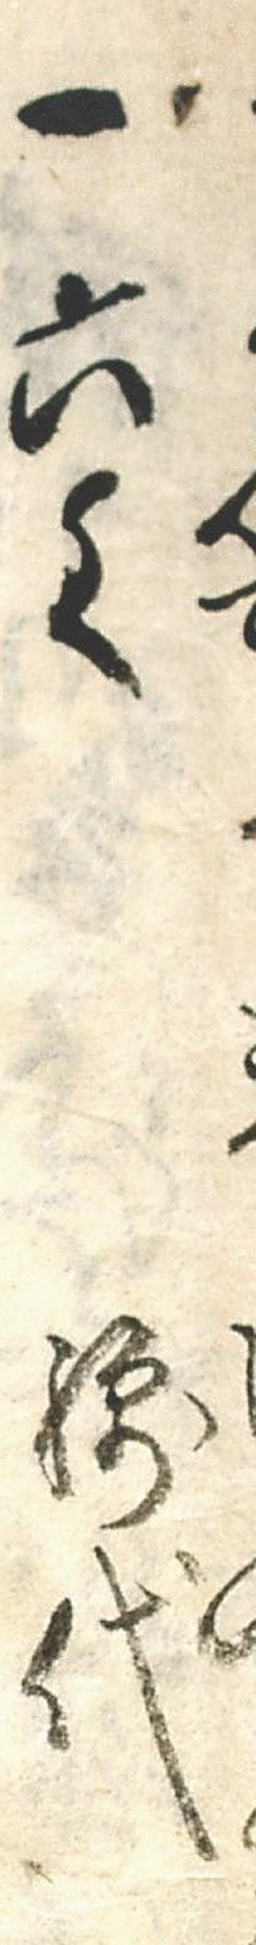一六匁綿代
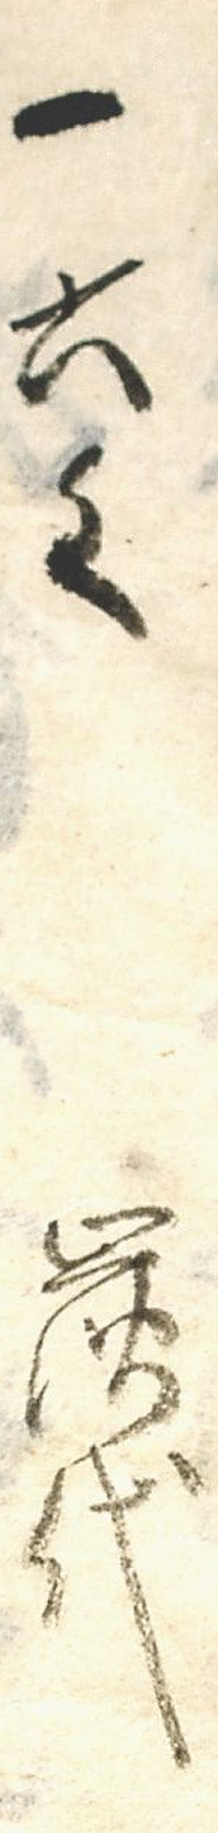一六匁炭代
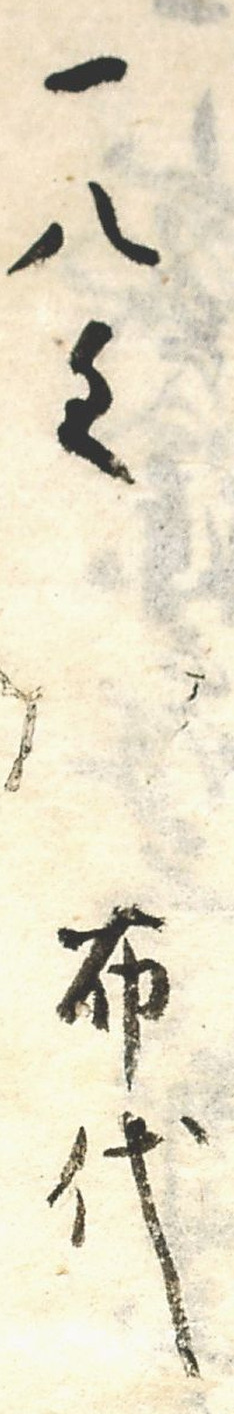一八匁布代
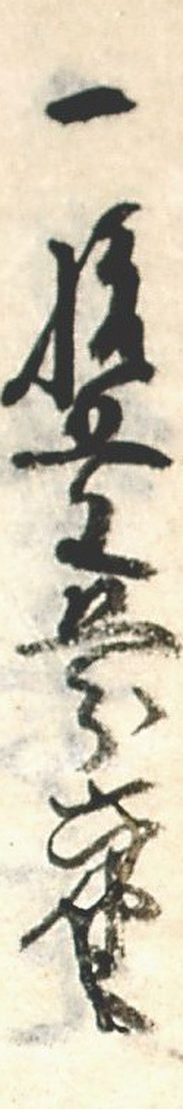九拾五匁三分弐厘
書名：御国産漆製法越法算建書共取替速判帳
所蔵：鳴門教育大学 Naruto University of Education
